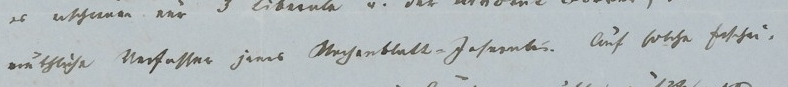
muthliche Verfasser jenes Morgenblatt-Inserates. Auf solche Erschei-
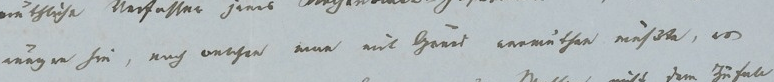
nungen hin, nach welchen man mit Grund vermuthen mußte, es
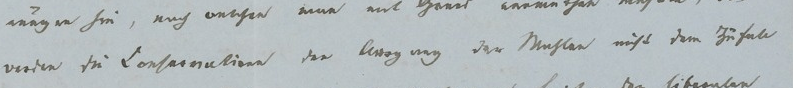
werden die Conservativen den Ausgang der Wahlen nicht dem Zufall
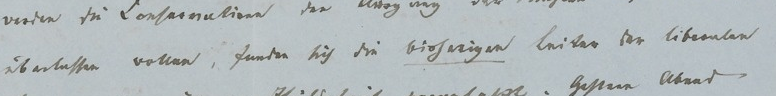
überlassen wollen, fanden sich die bisherigen Leiter der liberalen
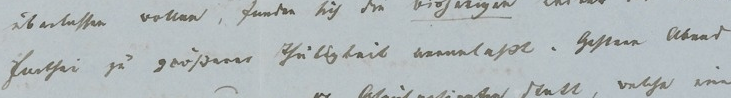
Parthei zu größerer Thätigkeit veranlaßt. Gestern Abend
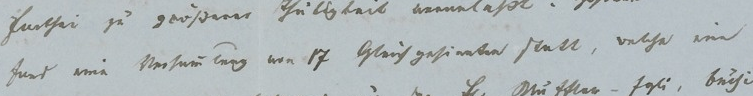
fand eine Versammlung von 17 Gleichgesinnten statt, welche eine
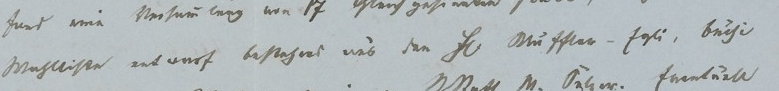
Wahlliste entwarf bestehend aus den Herrn Wäffler-Egli, Büchi
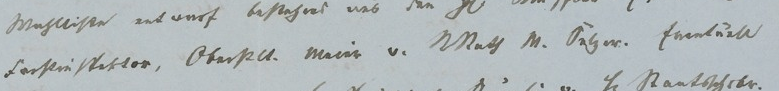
Forstinspektor, Oberstlt. Meier &. RRath M. Sulzer. Eventuell
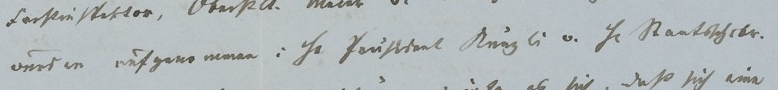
wurden aufgenommen: Hr Präsident Künzli &. Hr Staatsschrbr.
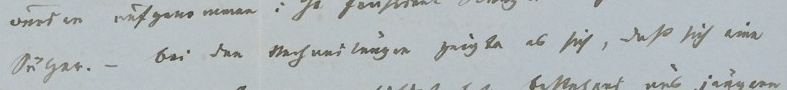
Sulzer. – Bei den Verhandlungen zeigte es sich, daß sich eine
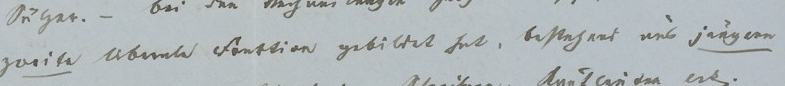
zweite liberale Fraktion gebildet hat, bestehend aus jüngern
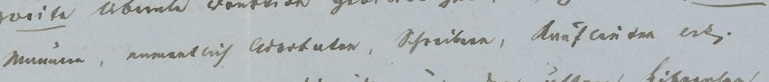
Männern, namentlich Advokaten, Schreibern, Kaufleuten ect,
